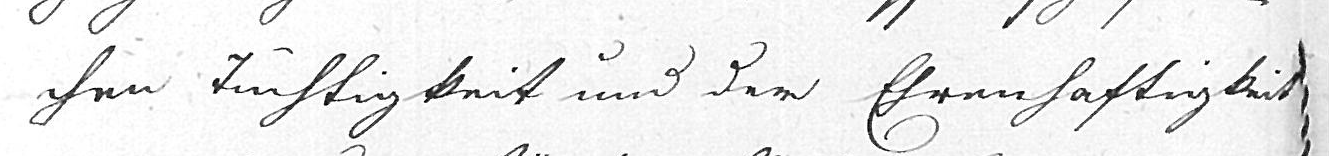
chen Tüchtigkeit und der Ehrenhaftigkeit
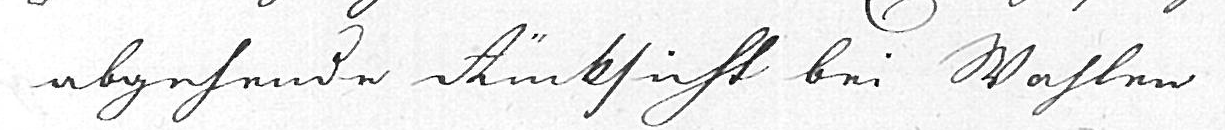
abgehenden Rücksicht bei Wahlen
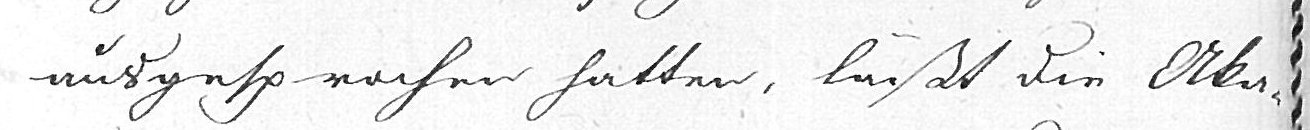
ausgesprochen hatten, läßt die Aka-
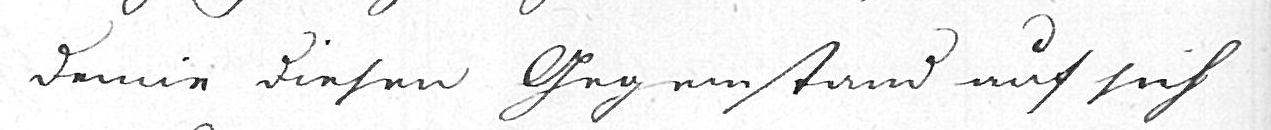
demie diesen Gegenstand auf sich
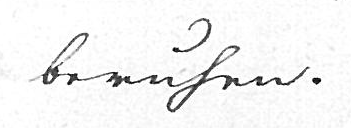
beruhen.
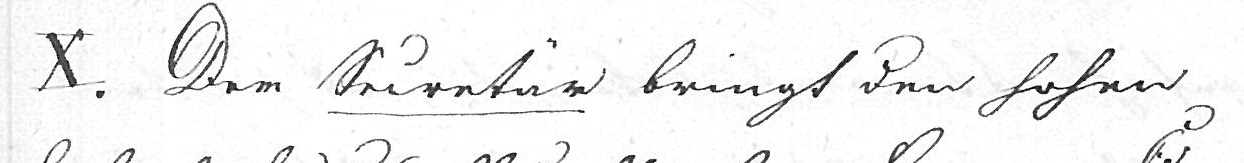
X. Der Secretär bringt den hohen
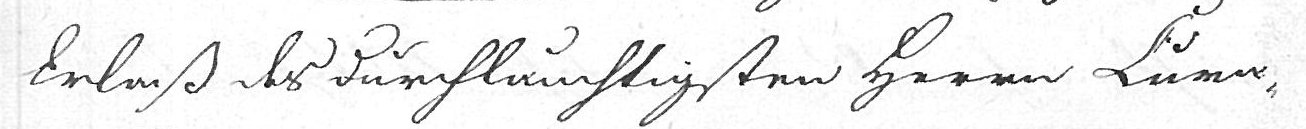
Erlaß des durchlauchtigsten Herrn Cura-
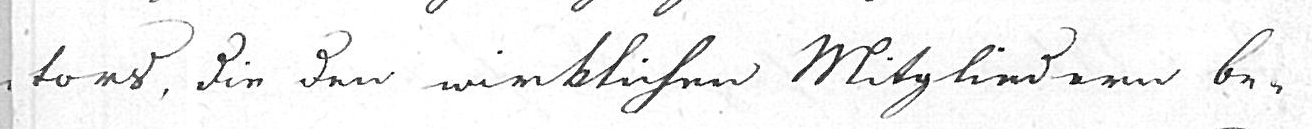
tors, die den wirklichen Mitgliedern be-
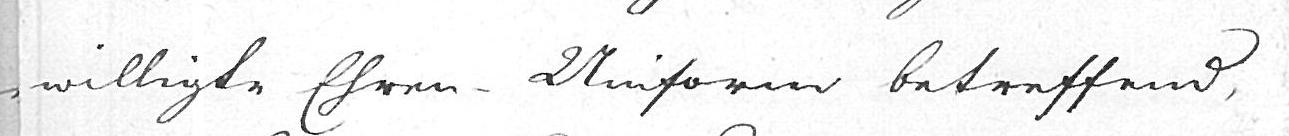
willigte Ehren-Uniform betreffend,
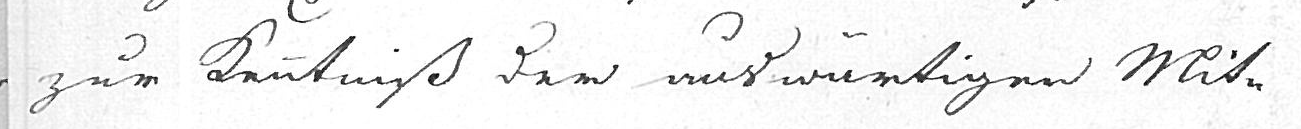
zur Kenntniß der auswärtigen Mit-
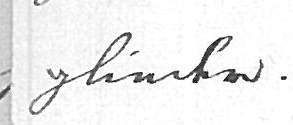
glieder.
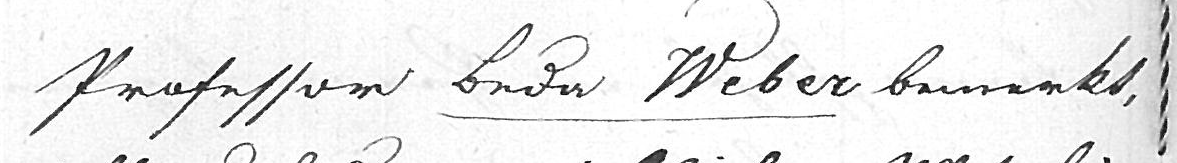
Professor Beda Weber bemerkt,
